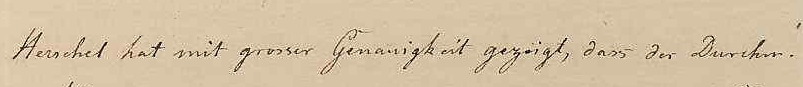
Herschel hat mit grosser Genauigkeit gezeigt, dass der Durchm.
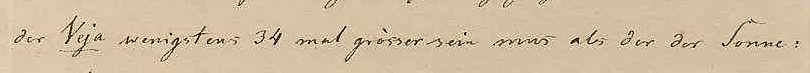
der Veja wenigstens 34 mal grösser sein mus als der der Sonne:
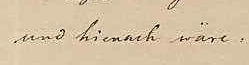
und hienach wäre:
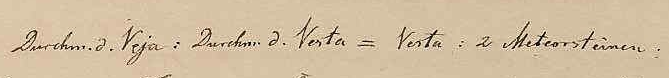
Durchm. d. Veja: Durchm. d. Vesta Vesta : 2 Meteorsteinen.
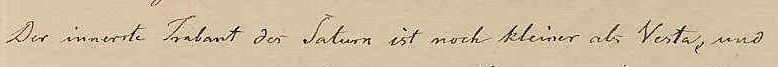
Der innerste Trabant des Saturn ist noch kleiner als Vesta, und
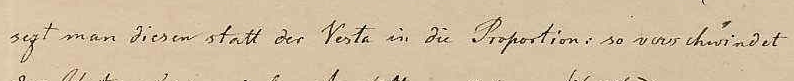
sezt man diesen statt der Vesta in die Proportion: so verschwindet
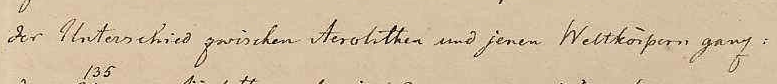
der Unterschied zwischen Aerolithen und jenen Weltkörpern ganz:
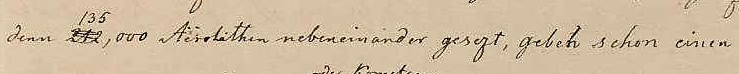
denn 212135,000 Aërolithen nebeneinander gesezt, geben schon einen
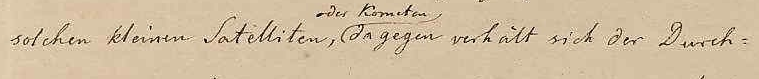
solchen kleinen Satellitendagegen verhält sich der Durch-
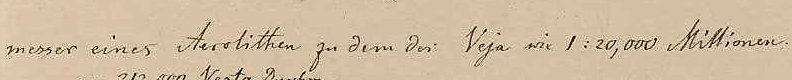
messer eines Aerolithen zu dem der Veja wie 1:20,000 Millionen
